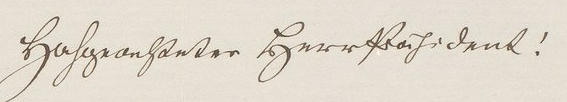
Hochgeachteter Herr Präsident!
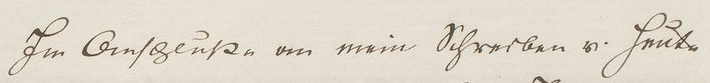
Im Anschluße an mein Schreiben v. heute
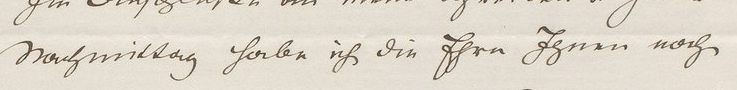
Nachmittag habe ich die Ehre Ihnen noch
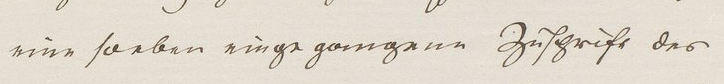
eine soeben eingegangene Zuschrift des
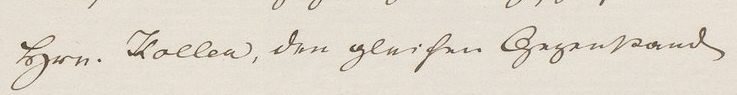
Hrn. Koller, den gleichen Gegenstand
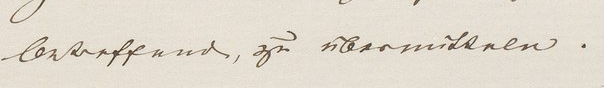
betreffend, zu übermitteln.
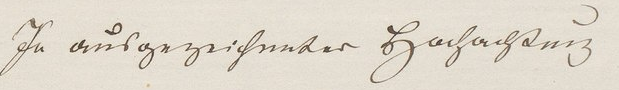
In ausgezeichneter Hochachtung
